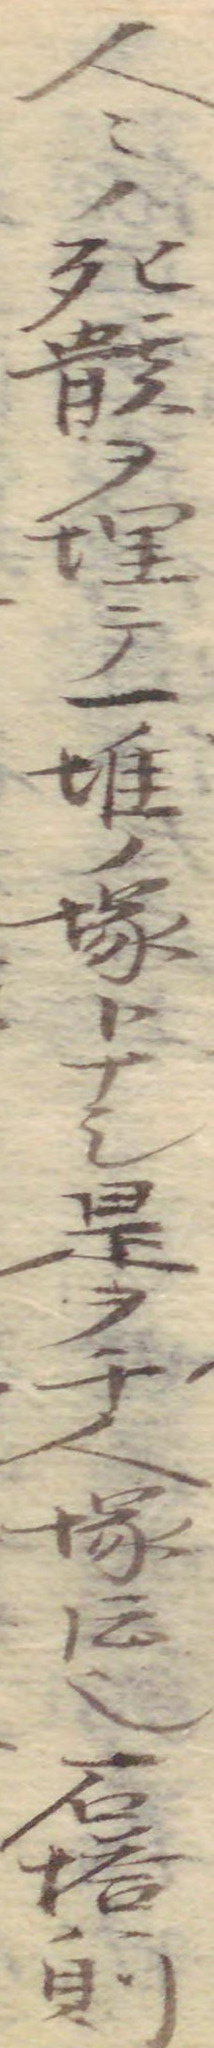人々ノ死骸ヲ埋テ一堆ノ塚トナシ是ヲ千人塚ト云也石塔ハ則
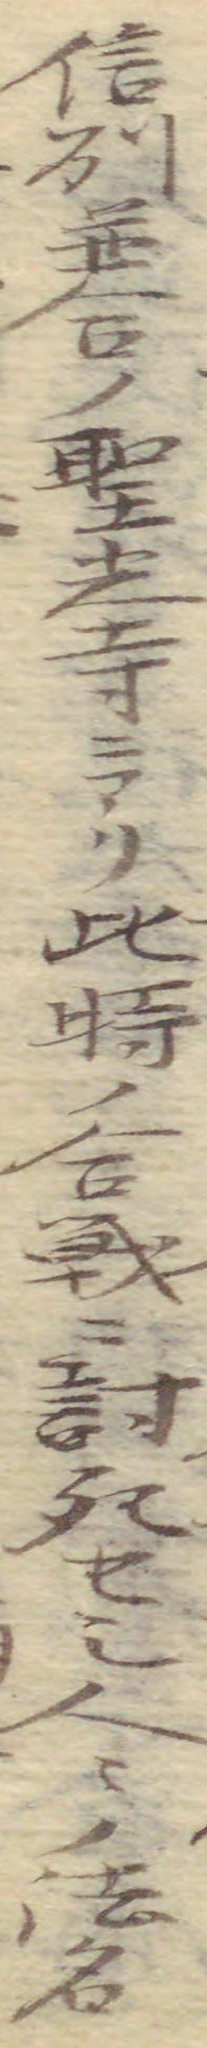信州並合ノ聖光寺ニアリ此時ノ合戦ニ討死セシ人々ノ法名

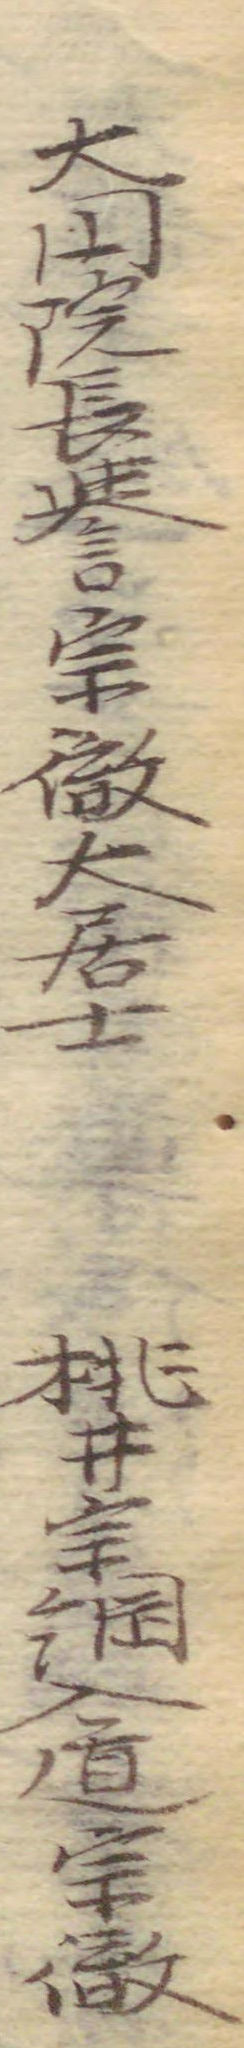大円院長譽宗徹大居士桃井宗綱入道宗徹
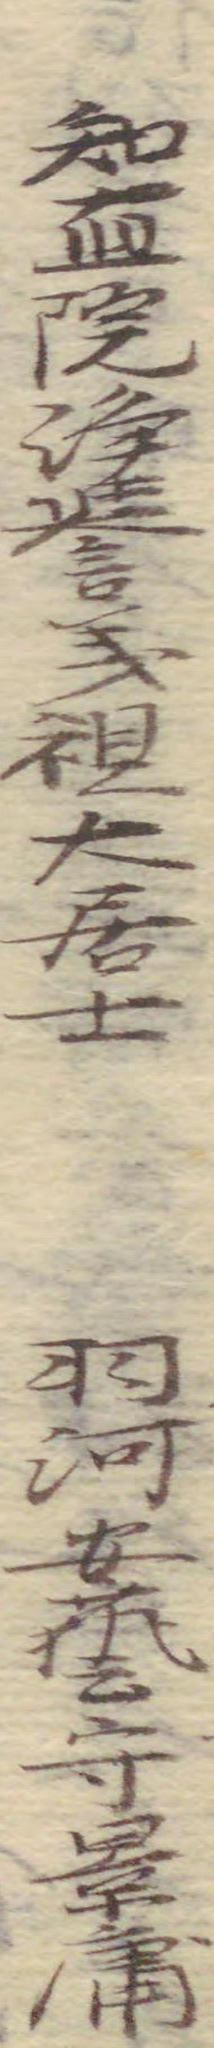知真院浄譽義親大居士羽河安芸守景庸
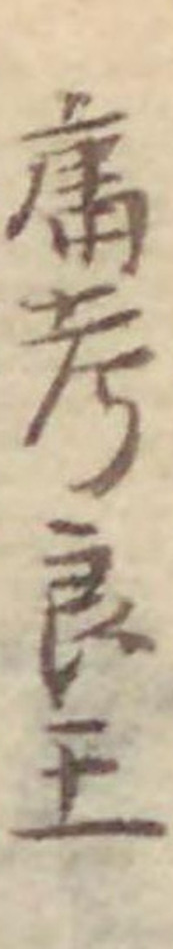庸考良王
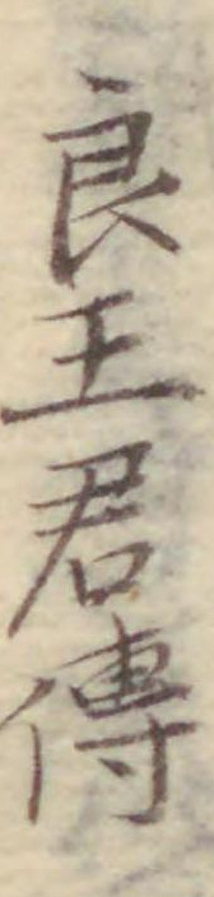良王君伝
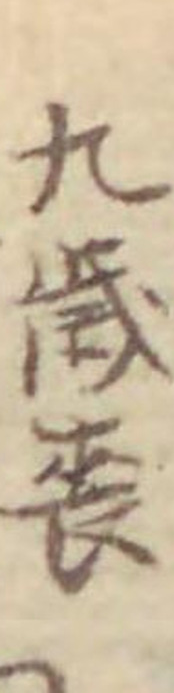九歳喪
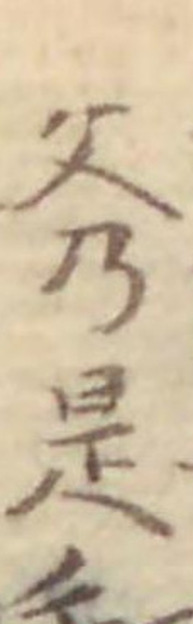父乃是
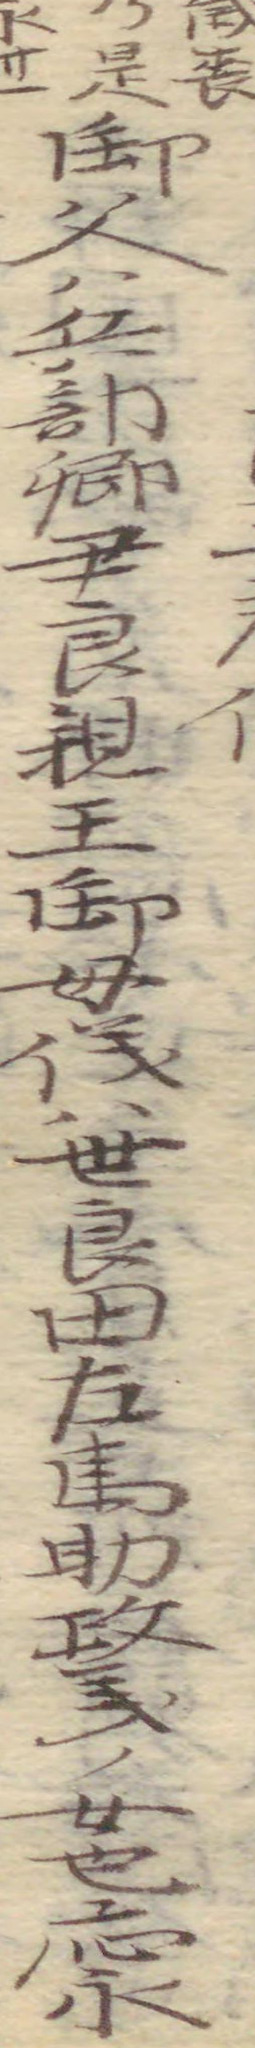御父ハ兵部卿尹良親王御母儀ハ世良田左馬助政義ノ女也応永
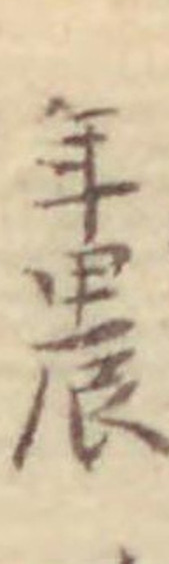年甲辰
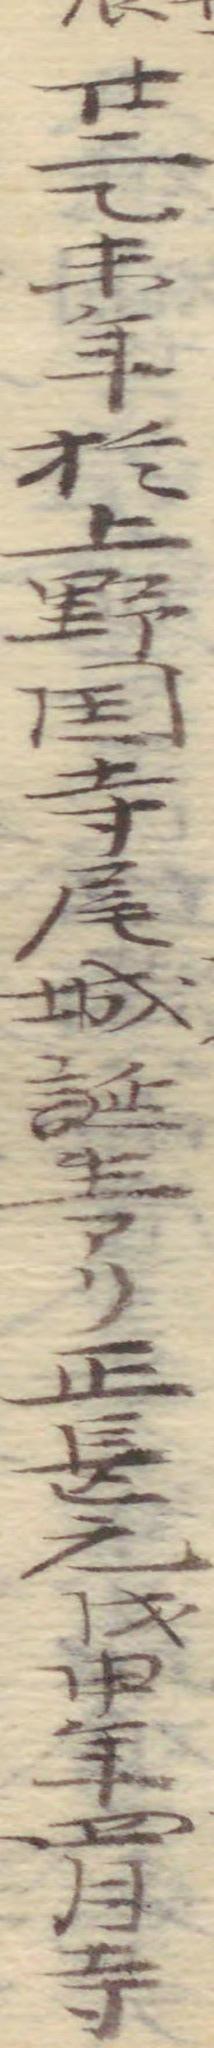廿ニ乙未年於上野国寺尾城誕生アリ正長元戌申年四月寺
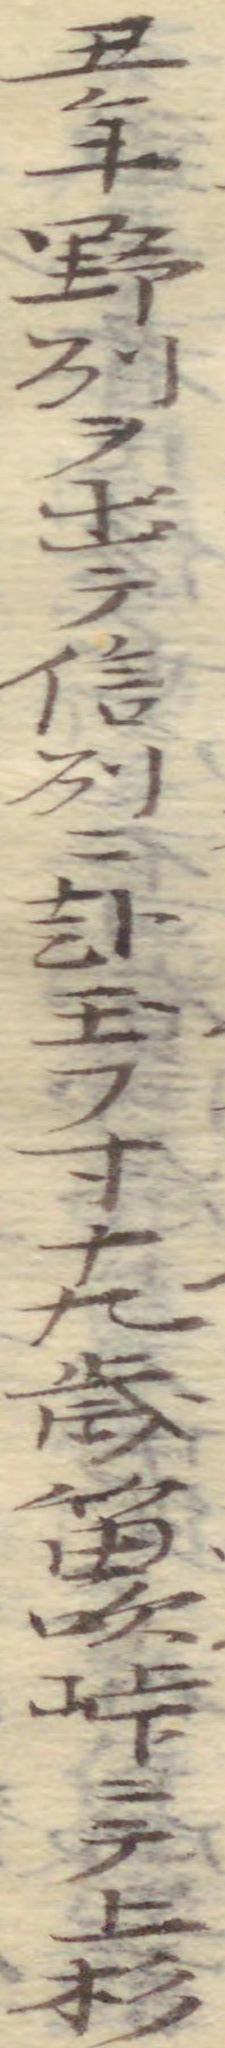丑年野州ヲ出テ信州ニ赴玉フ寸十九歳笛吹峠ニテ上杉
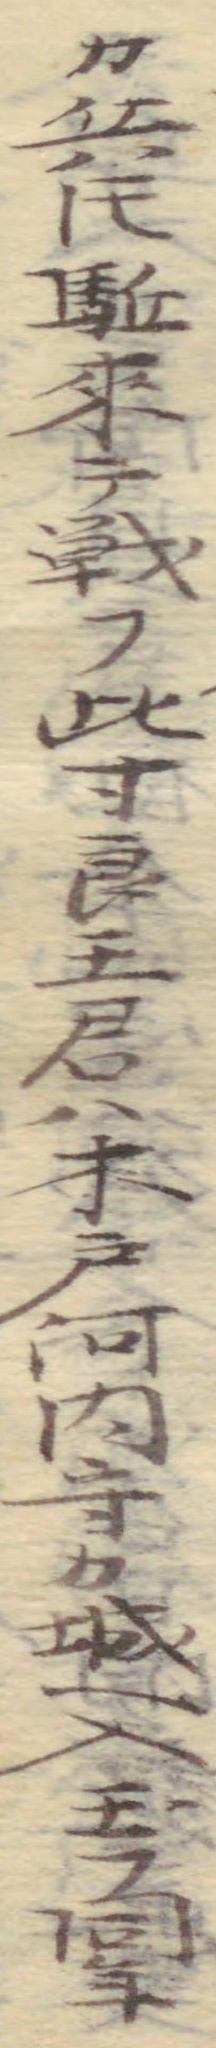カ兵トモ駈来テ戦フ此寸良王君ハ木戸河内守カ城へ入玉フ同年
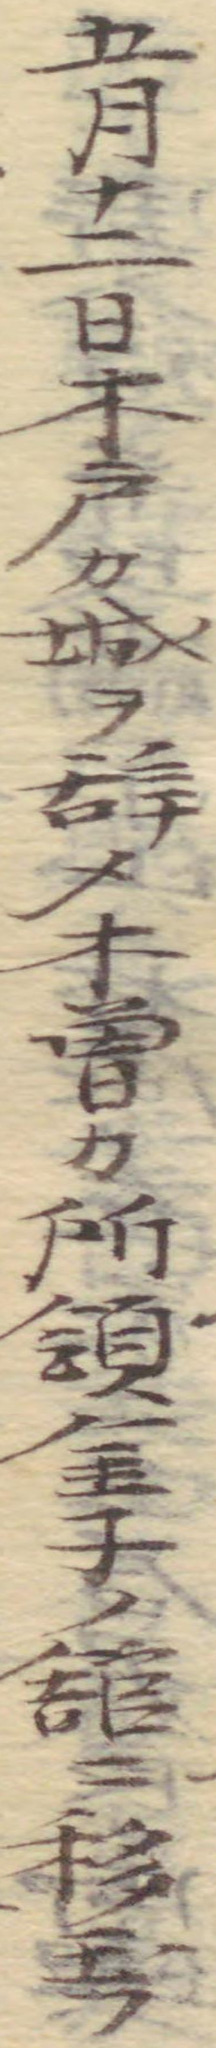五月十二日木戸カ城ヲ辞シテ木曽カ所領金子ノ館ニ移玉フ
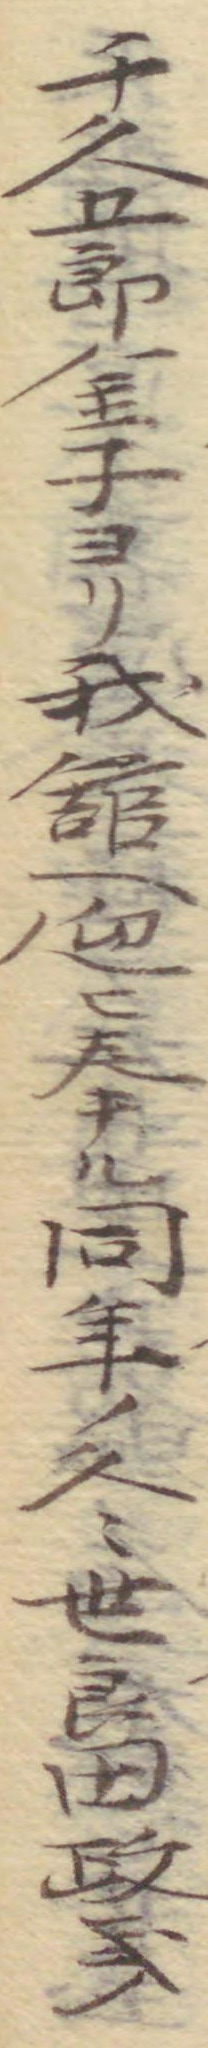千久五郎金子ヨリ我館へ迎ヒ奉ル同年ノ冬世良田政義
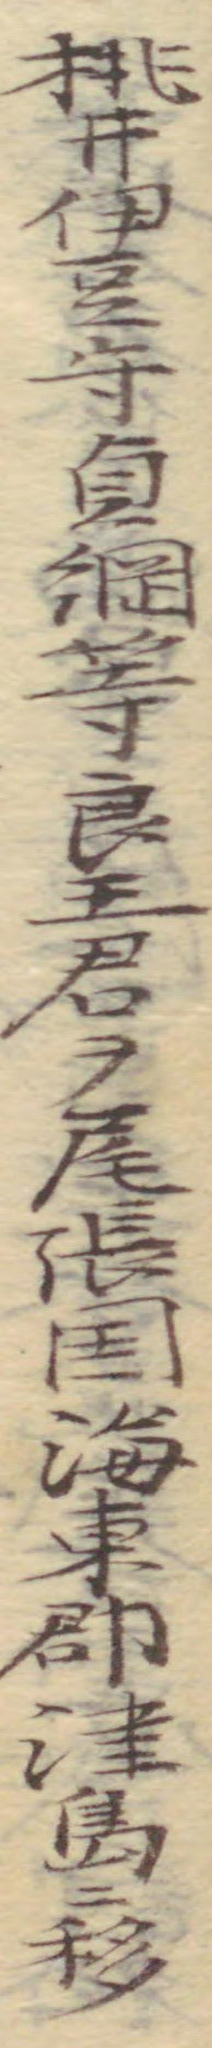桃井伊豆守貞綱等良王君ヲ尾張国海東郡津島ニ移
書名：鶯宿雑記. 巻199-200
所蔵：国立国会図書館 National Diet Library, JAPAN
